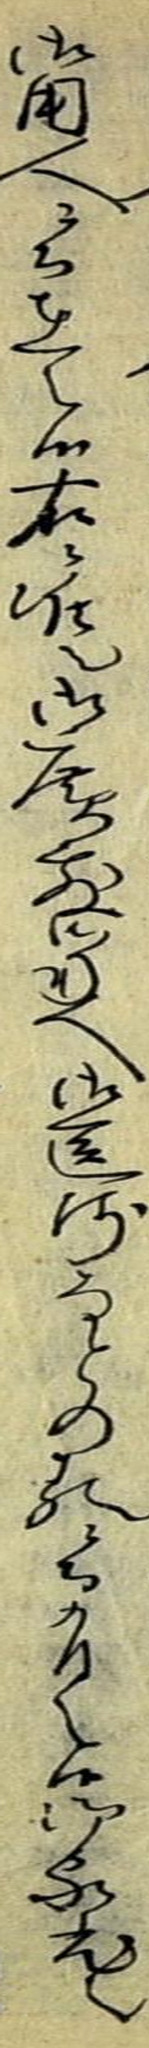御用人ニ而在之候右ニ准シ御広敷御用人御医師なとの類ニ而有之候御家老之
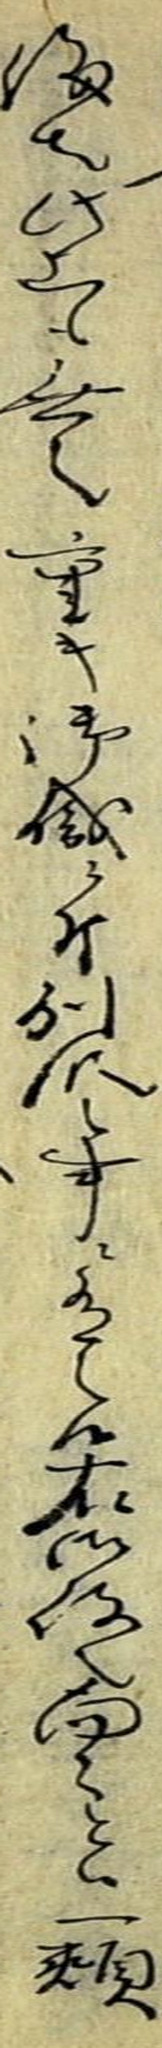儀者此上も無之重キ御職ニ付別段之事ニ有之候右御役之向々とハ一類
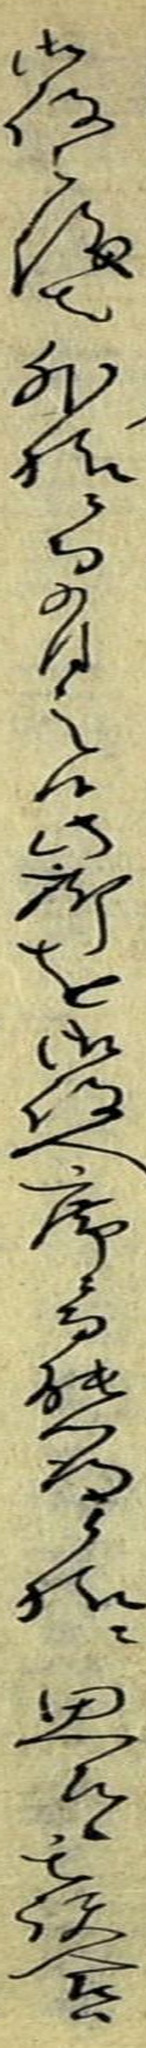御役之儀者外様ニ而有之候此所を御役人席ニ而能心得候様ニ思召候其訳合ハ
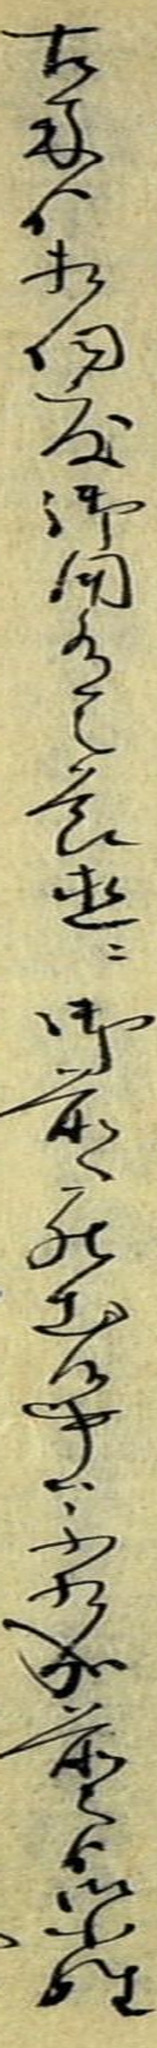古来ゟ相伺度御用有之節直ニ御前へ罷出候事ハ不相成前々ゟ御小姓
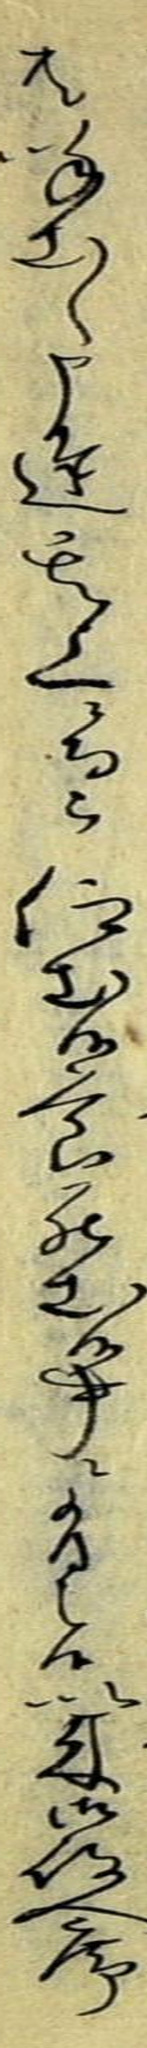共呼出し申達其上ニ而被仰出候節罷出候事ニ有之候以来御役人席
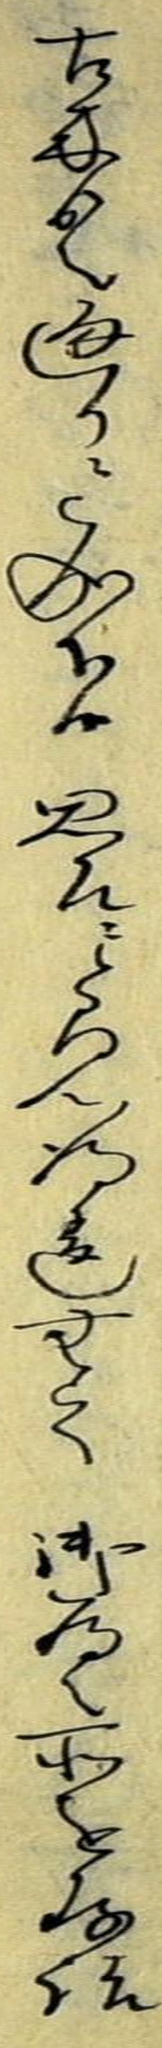古来ゟ之通りニ被成下候思召ニ候間心得違無之御為之所を存詰

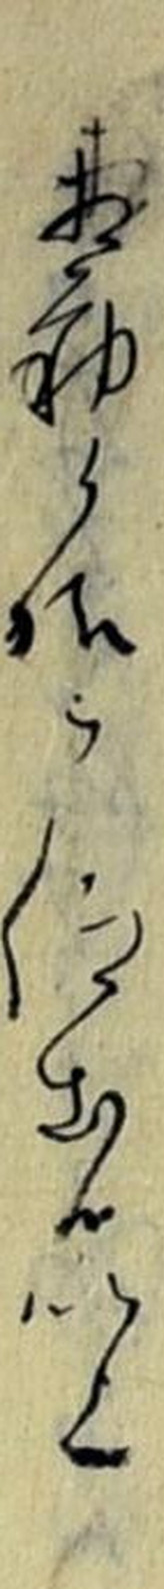相勤候様被仰出候以上
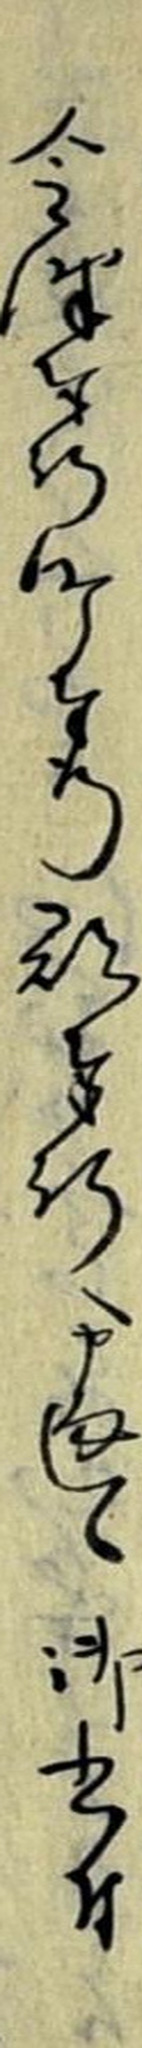金津奉行町奉行郡奉行へ申通候御書付
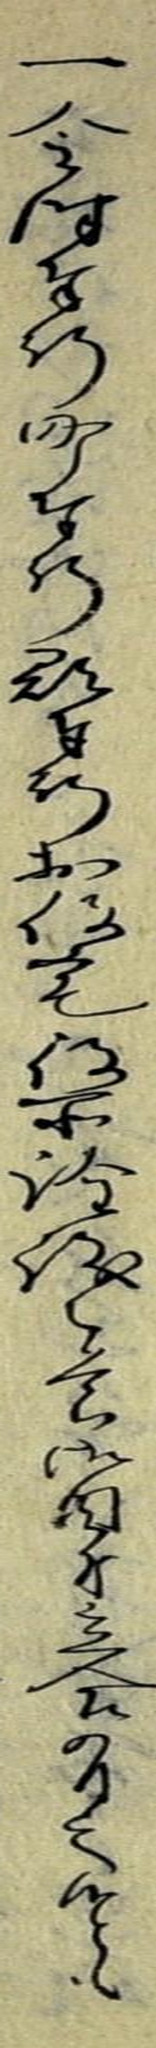一金津奉行町奉行郡奉行於役宅役所詮議之節御目付立合有之候とも
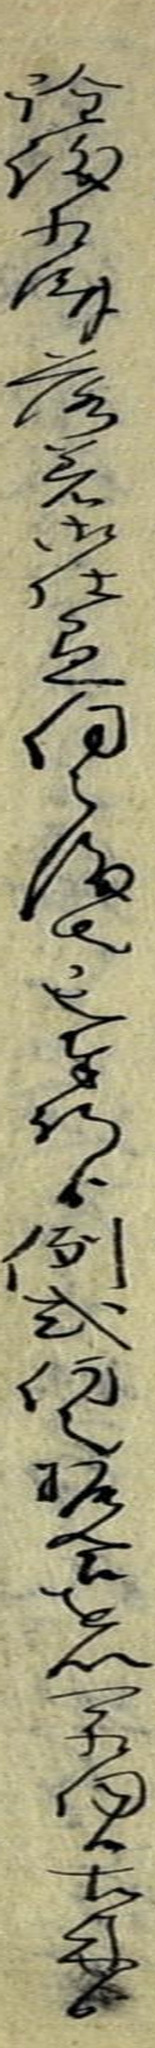詮議相済落着御仕置伺之儀者其奉行ゟ例式伺之振合を以可罷伺候古来ゟ
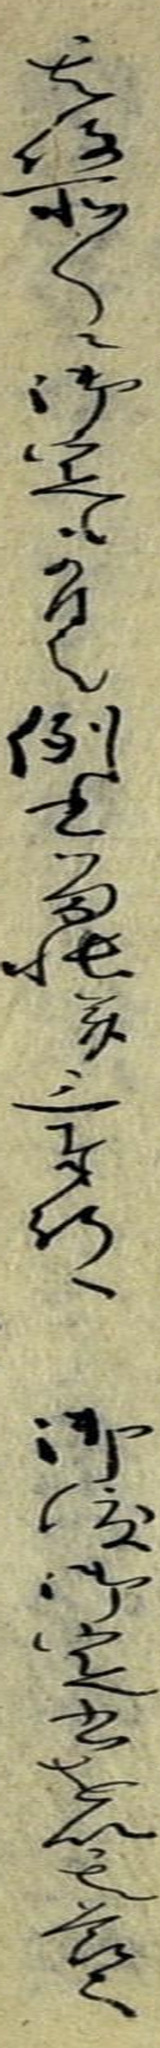其役所〳〵ニ御定も有之例書留帳并三奉行へ御渡御定書を以其節之
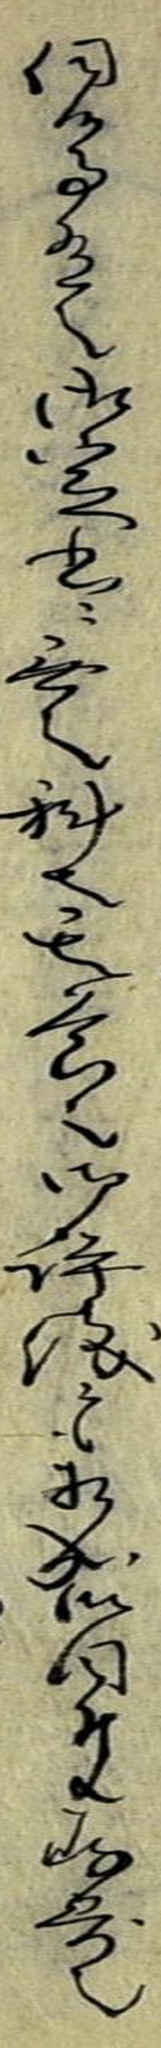伺候事有之御定書ニ無之科者其節之御評議ニも相成御目付共存寄之
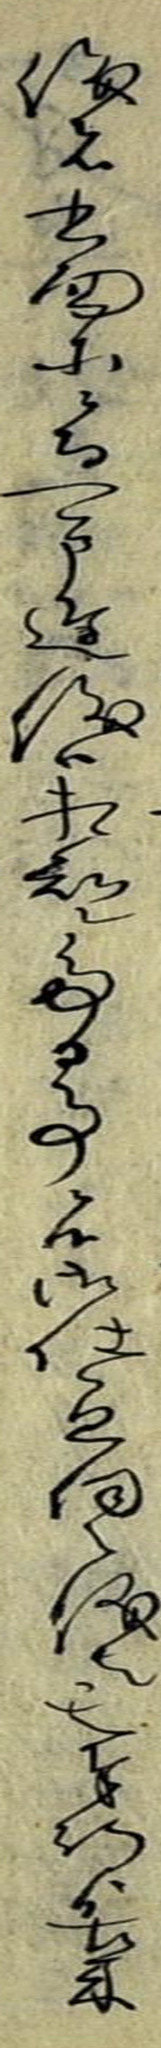儀者書面等ニ而可申達儀ハ相知レたる事ニ候御仕置伺之儀者其奉行ゟ古来
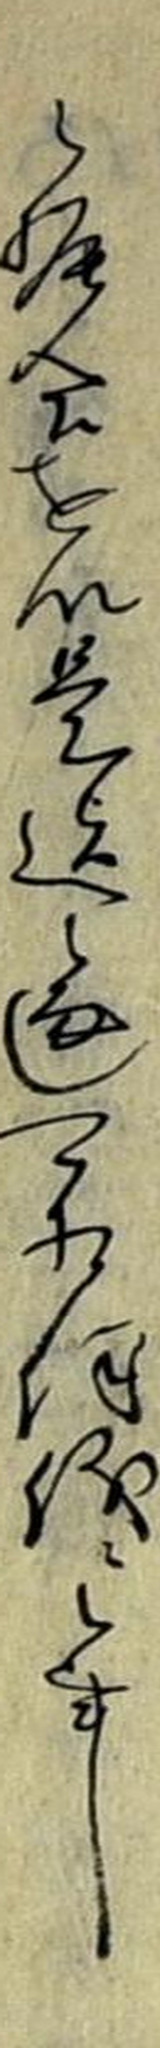之振合を以是迄之通可相伺儀ニ候事
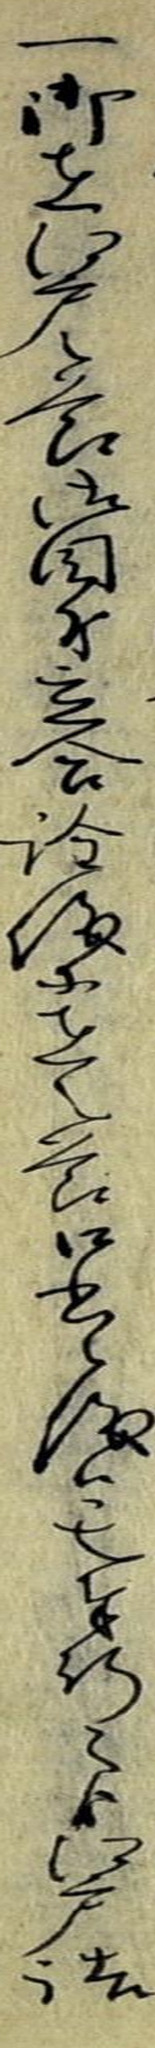一御在江戸之節御目付立合詮議等在之節口書之儀ハ其奉行々ゟ江戸詰
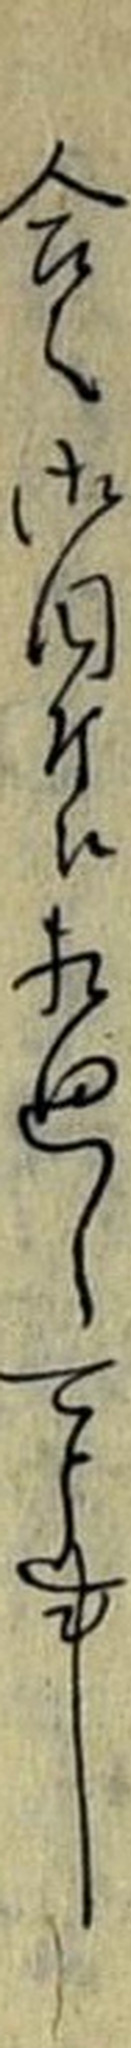合之御目付江相廻し可申事
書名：命令之部 三
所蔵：福井県文書館 Fukui Prefectural Archives
